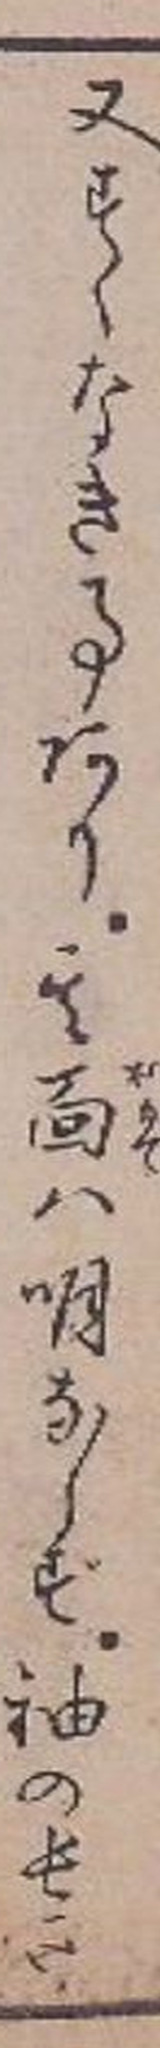又すくなき事あり、其面は明ならず、袖の長き
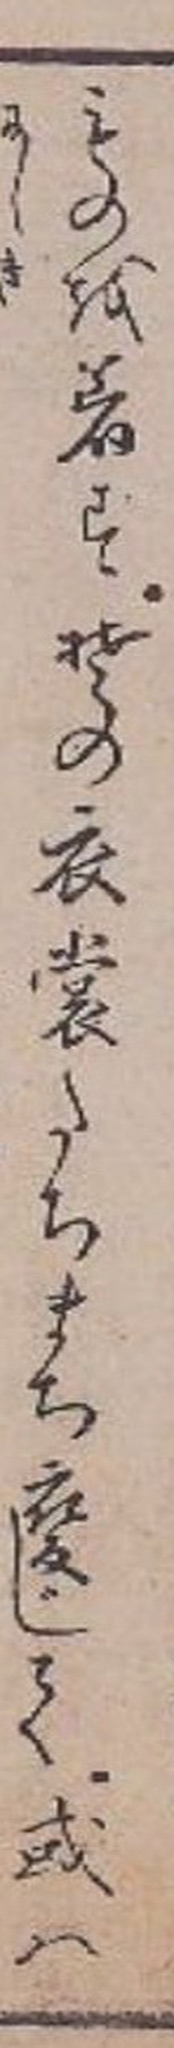ものを着す、その衣裳たちまち変じて、或は
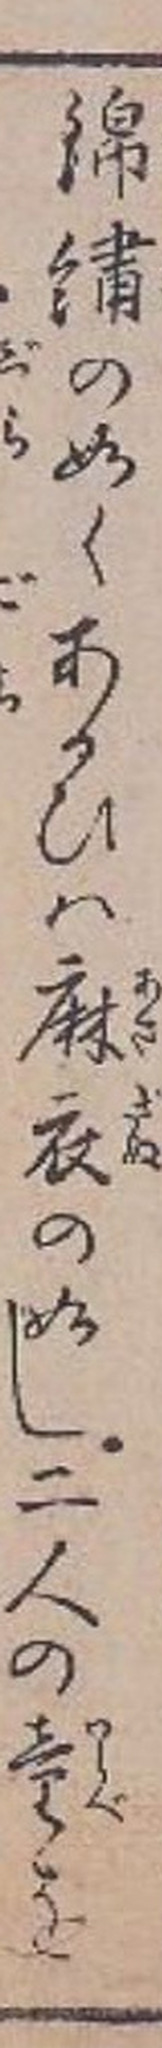錦繡の如くあるひは麻衣の如し、二人の童を
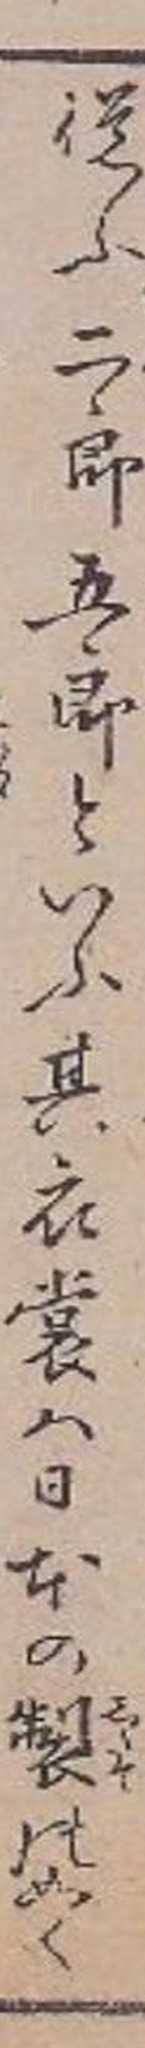従ふ、二郎五郎といふ其衣裳は日本の製の如く
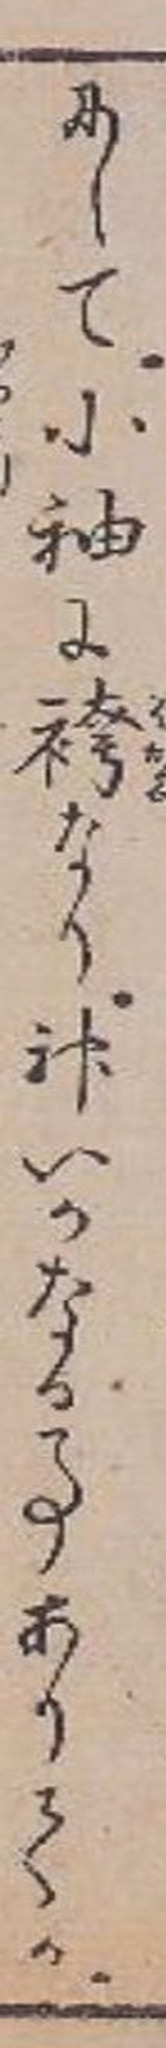にして、小袖に袴なり、神いかなる事ありてか、
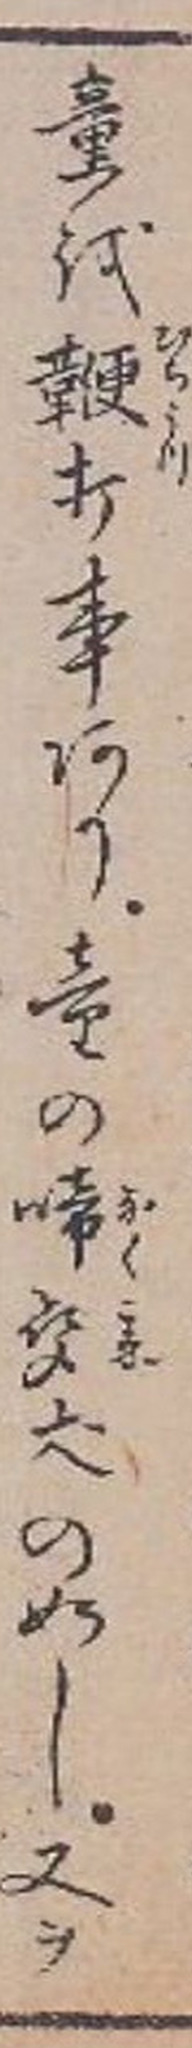童を鞭打事あり、童の啼声犬の如し、又ヲ
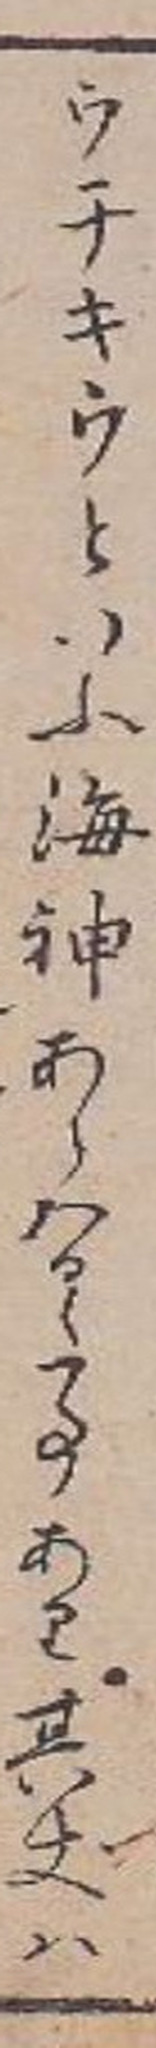ウチキウといふ海神あらはるゝ事あり、其丈は
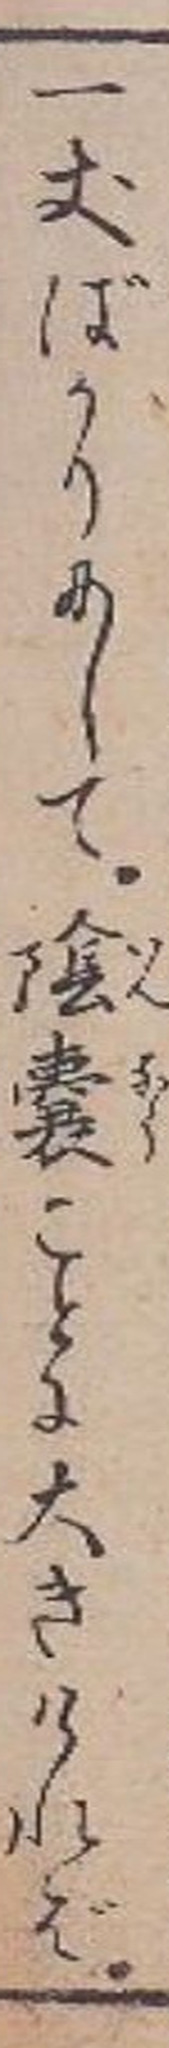一丈ばかりにして、陰嚢ことに大きければ、
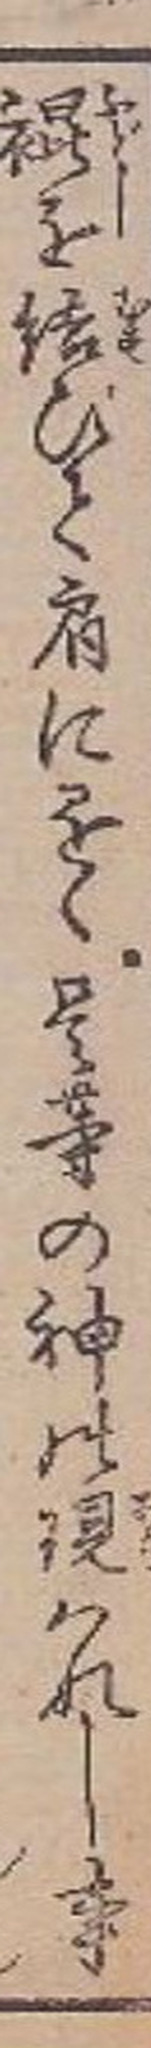緄を結びて肩に懸く、是等の神の現はれし事
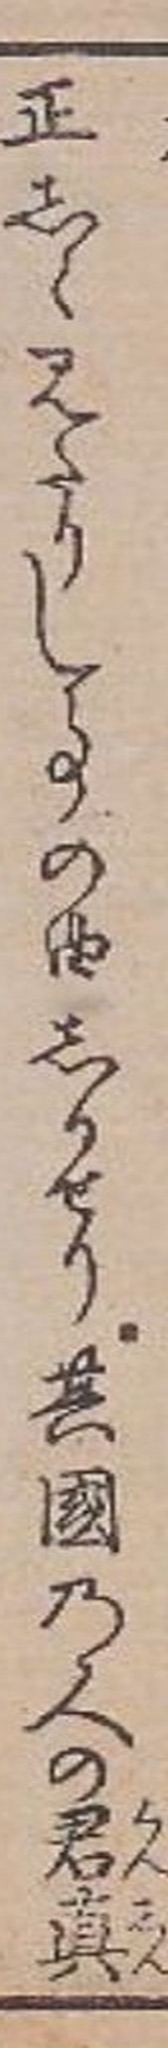正しく見たりし事の由しるせり、其国の人の君真
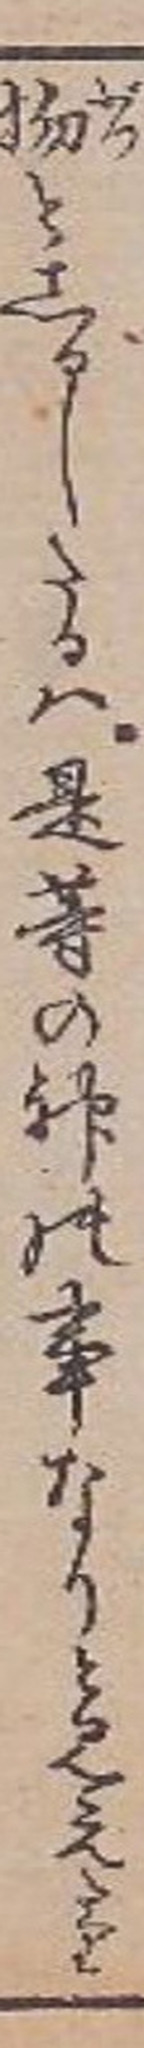物としるしたるは、是等の神の事なりと見えたり
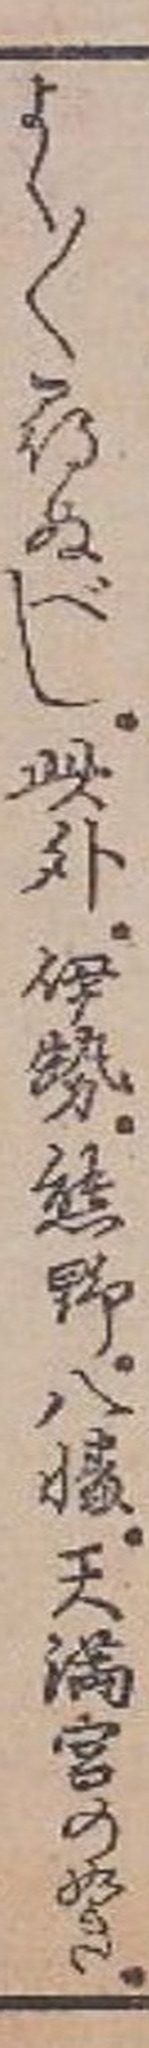よく〳〵尋ぬべし、此外、伊勢、熊野、八幡、天満宮の如き、
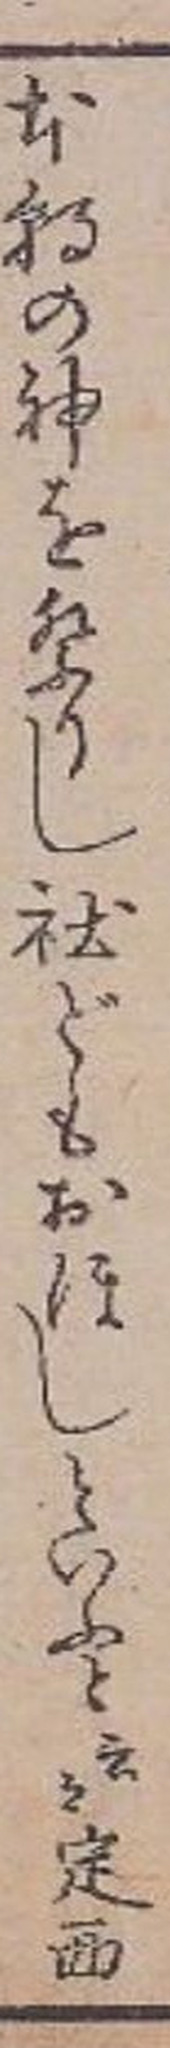本朝の神を祭りし社どもおほしといふと云云定西
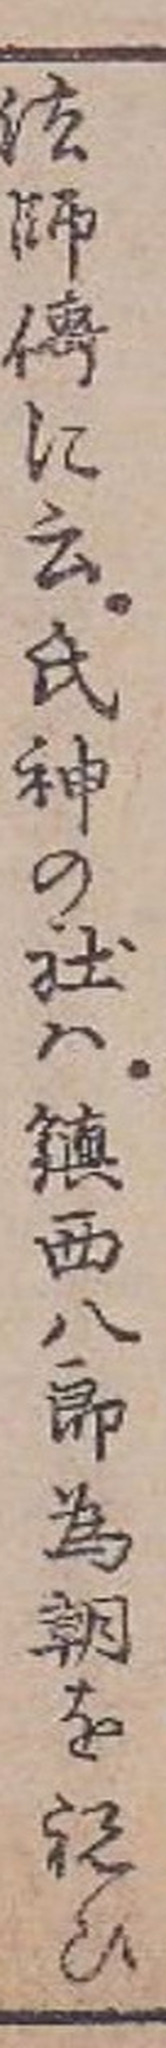法師伝に云、氏神の社は、鎮西八郎為朝を祝ひ
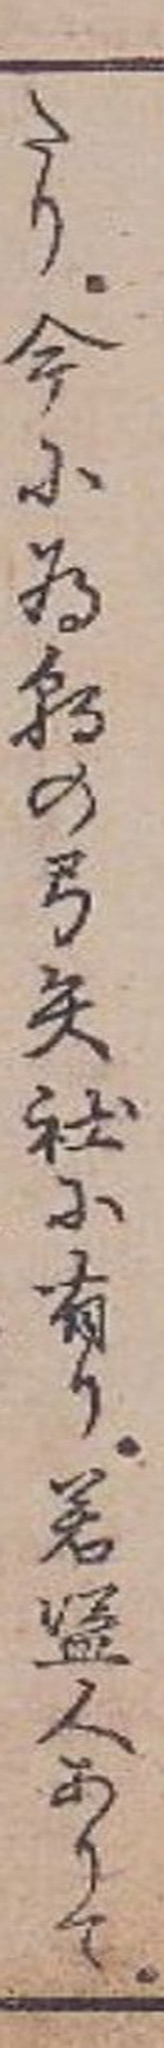たり、今に為朝の弓矢社に有り、若盗人ありて、
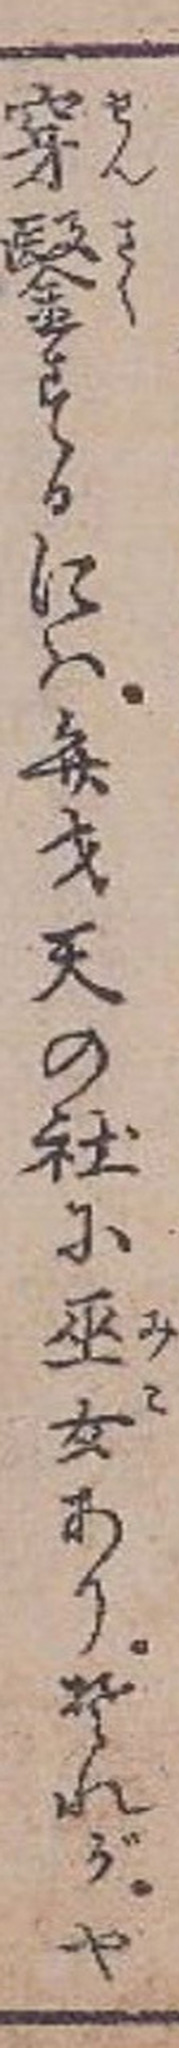穿鑿するには、弁才天の社に巫女あり、それが、ヤ
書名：琉球談
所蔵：University of the Ryukyus Library
